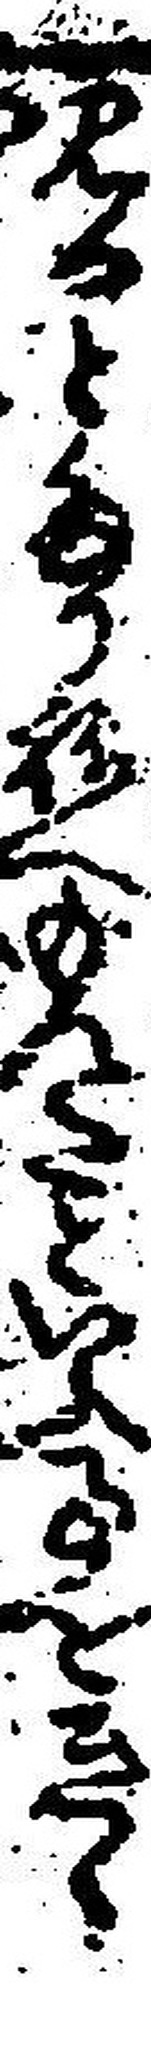みるとたりねへもんたといふ事をきゝ
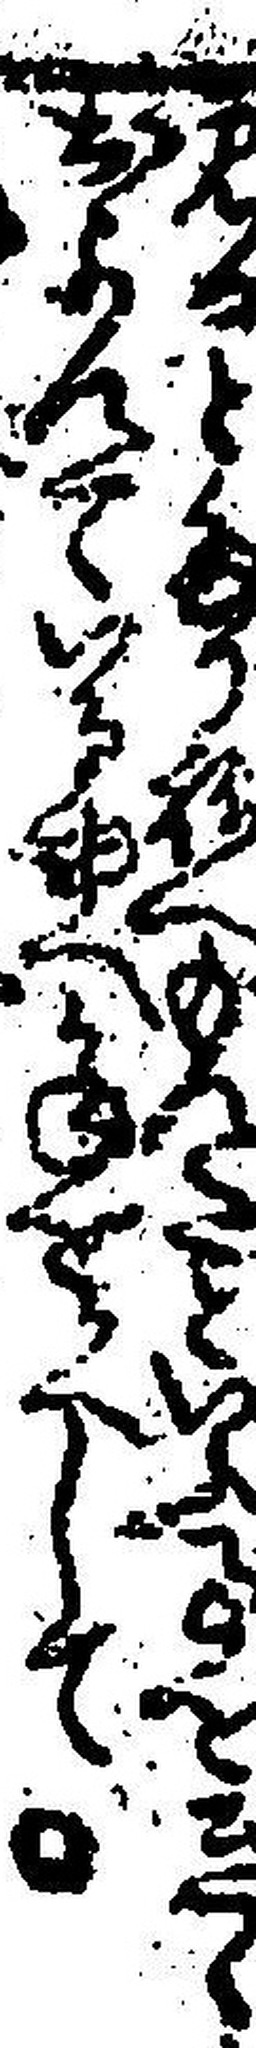およんているゆへかねをかへして
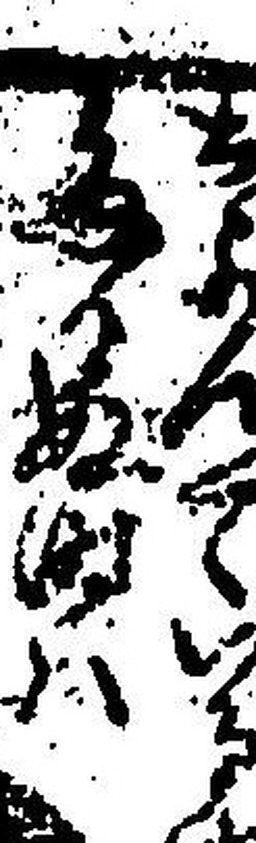たりぬ時は
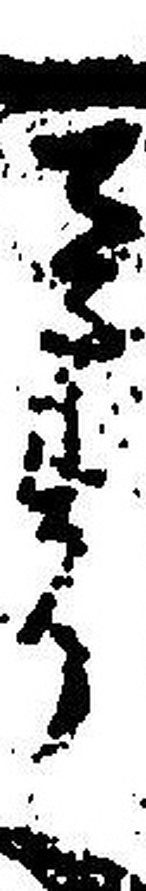てこすり
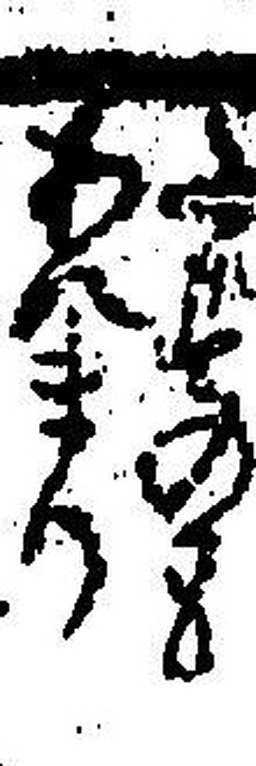あんまり
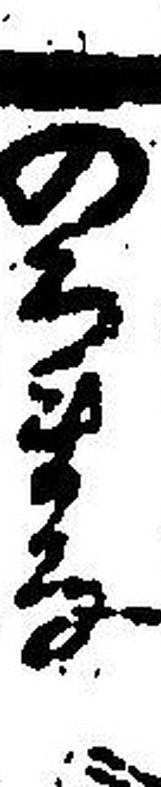のろまな
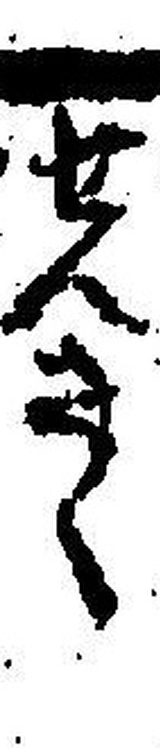せんさく
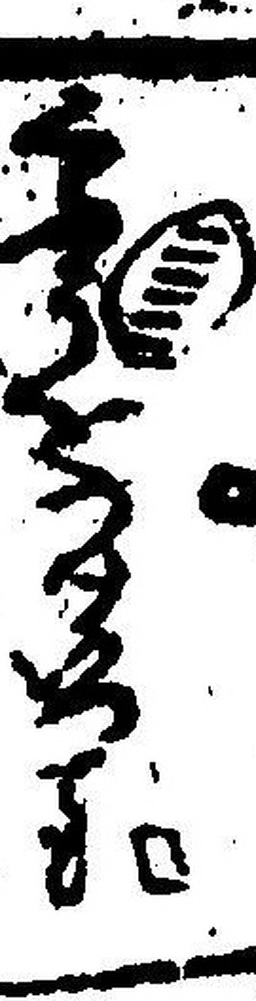くふうをつけいつても
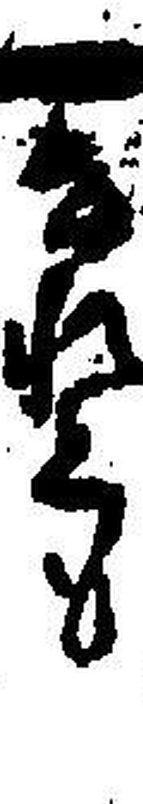なれとも
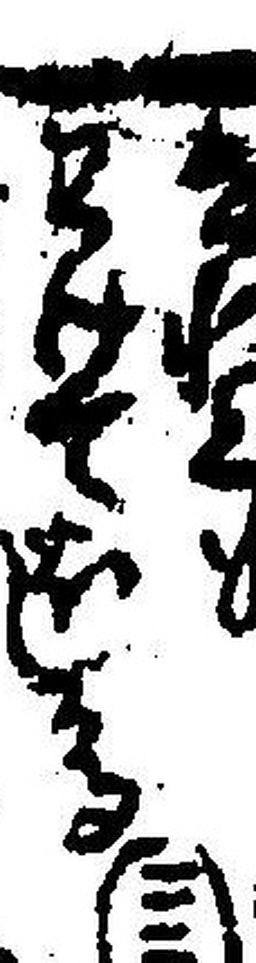わけてほしかる
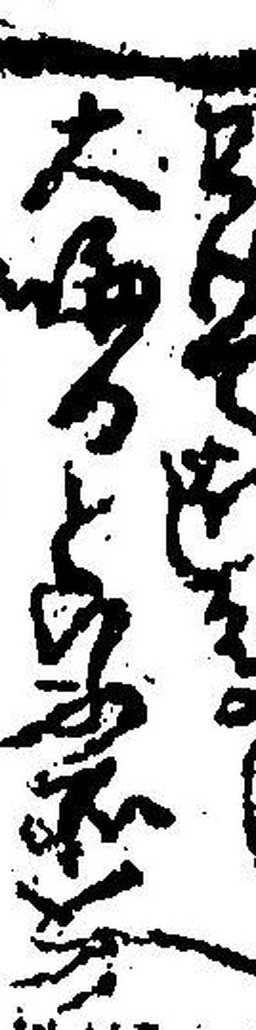大晦日といふ所を
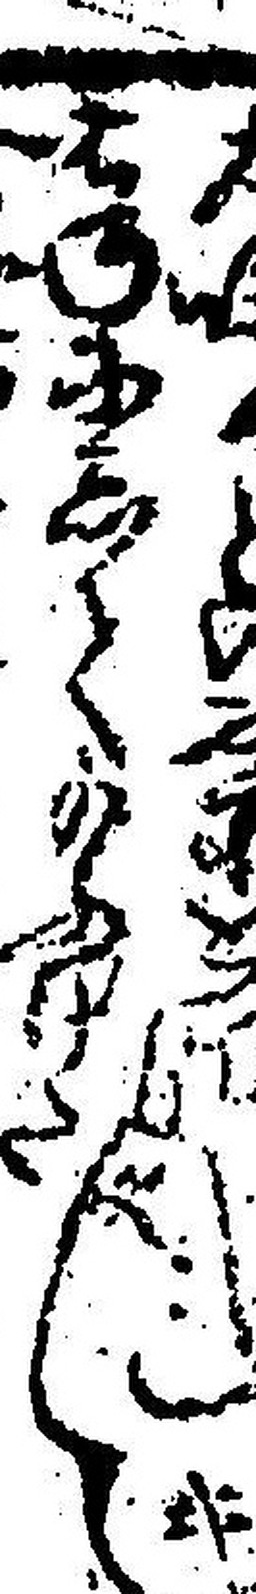はねにしてもふけた
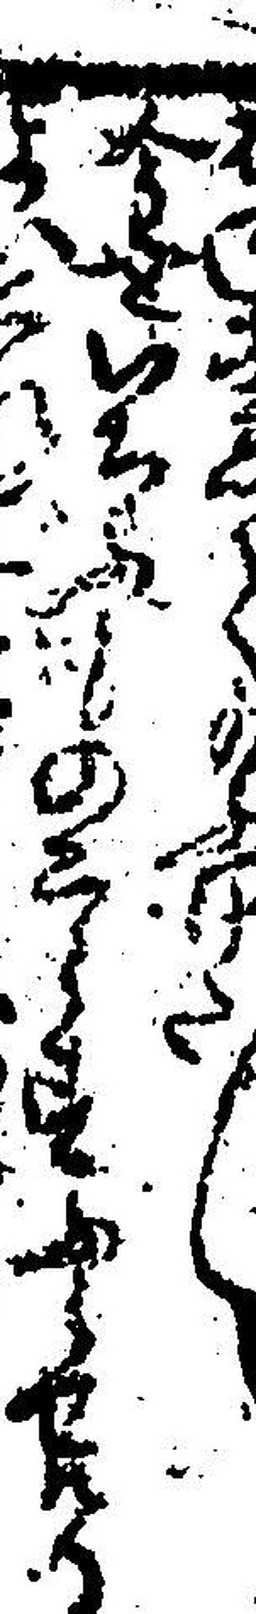金をいちふものこらすふらせけり
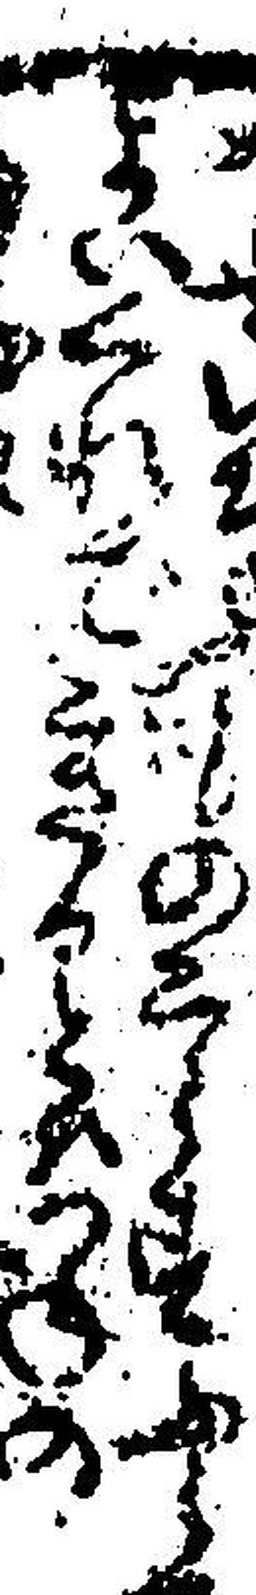よいくれでこさるとはかねの
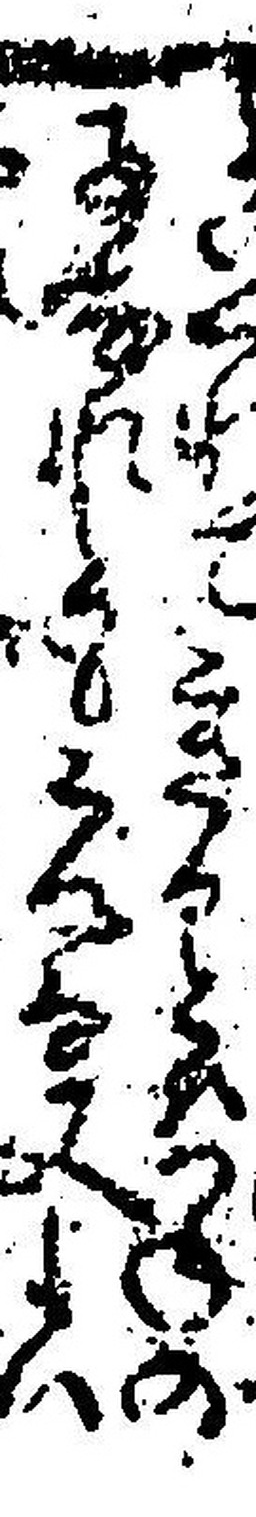事なれともこんな又よい
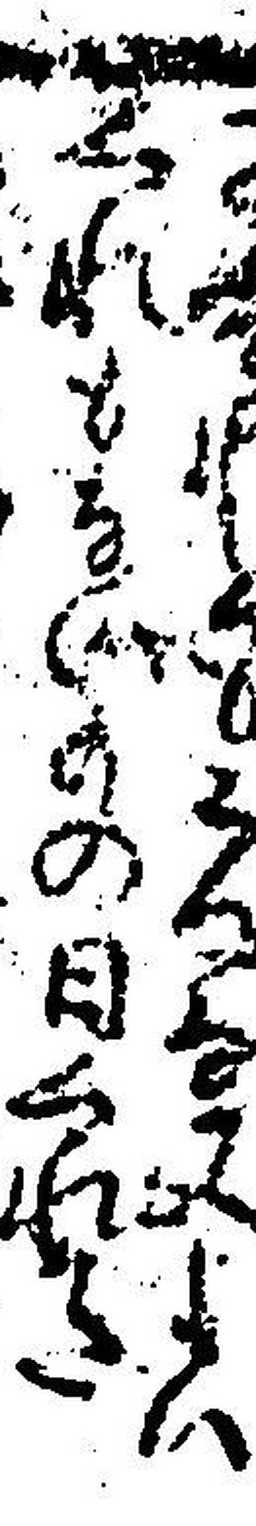くれもないもの日くれかた
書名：天竺儲之筋 / 市場通笑作
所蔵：東京大学総合図書館 General Library in the University of Tokyo, JAPAN
